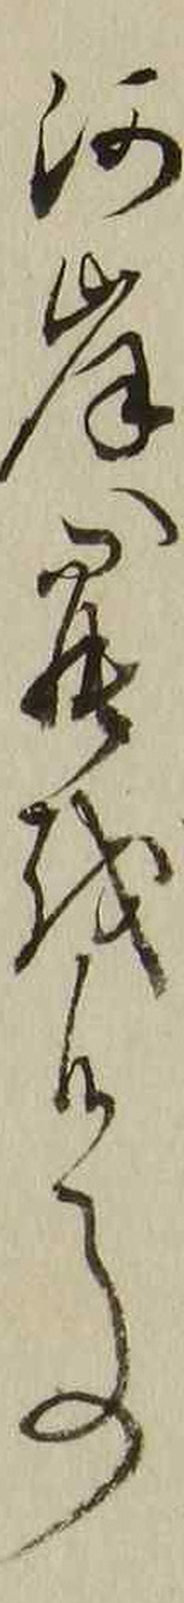河岸へ罷越候事
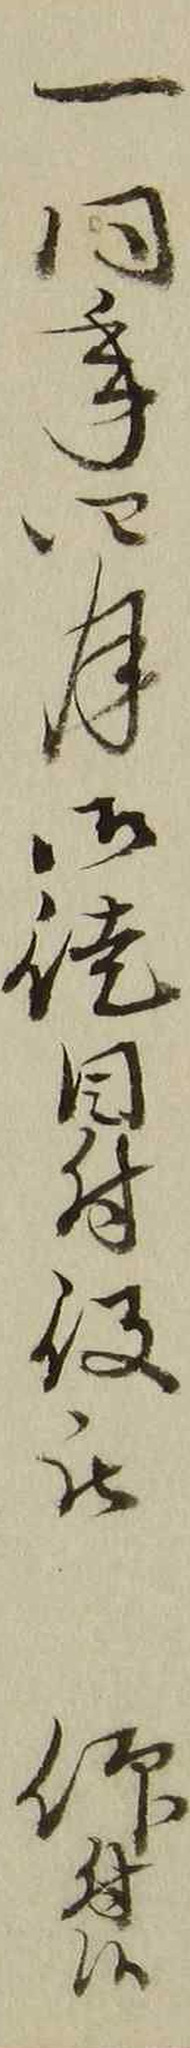一同年四月御徒目付役被仰付候
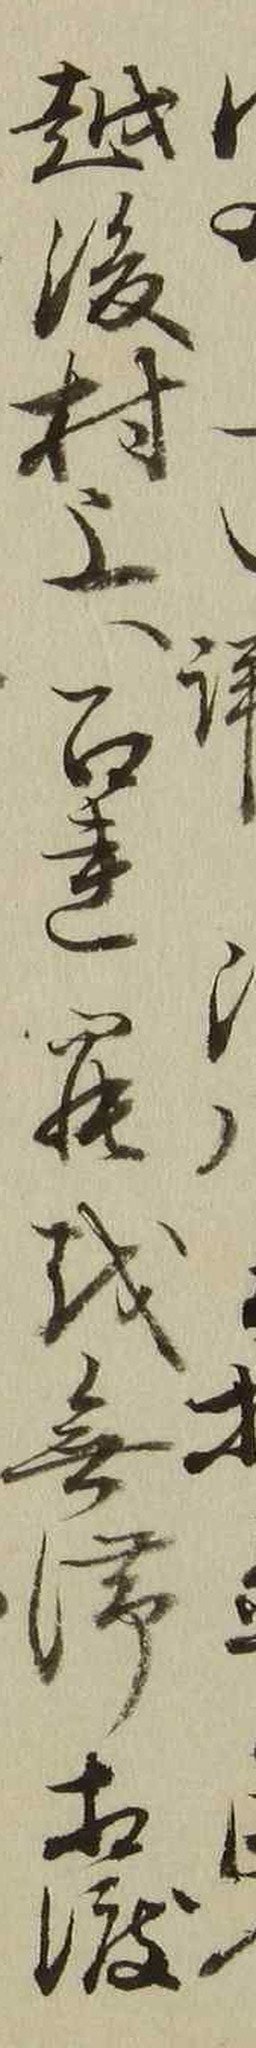越後村上へ召連罷越無滞相渡
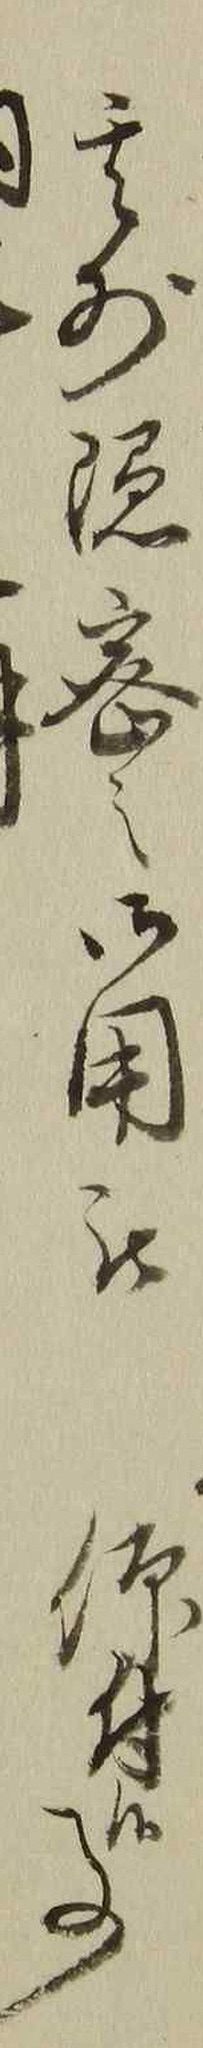其外隠密之御用被仰付候事
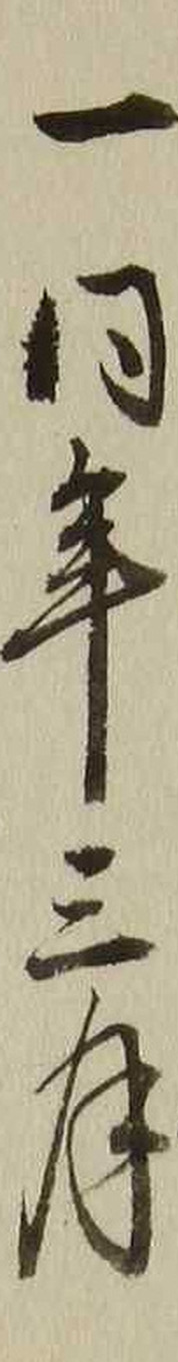一同年三月
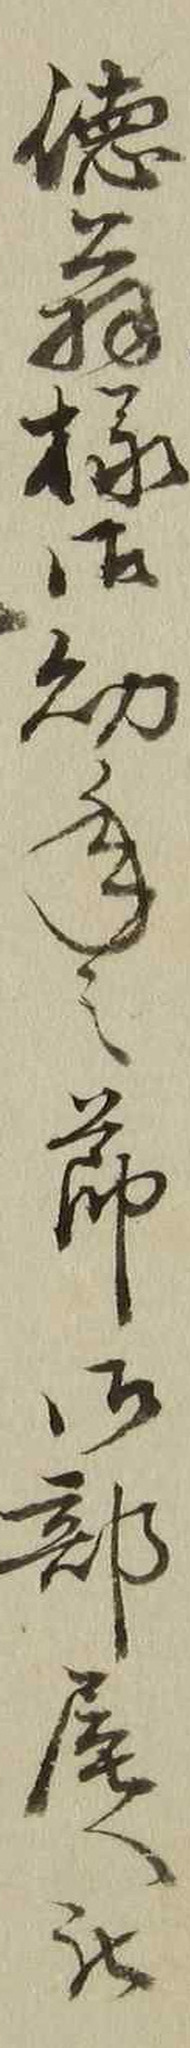徳翁様御幼年之節御部屋へ被
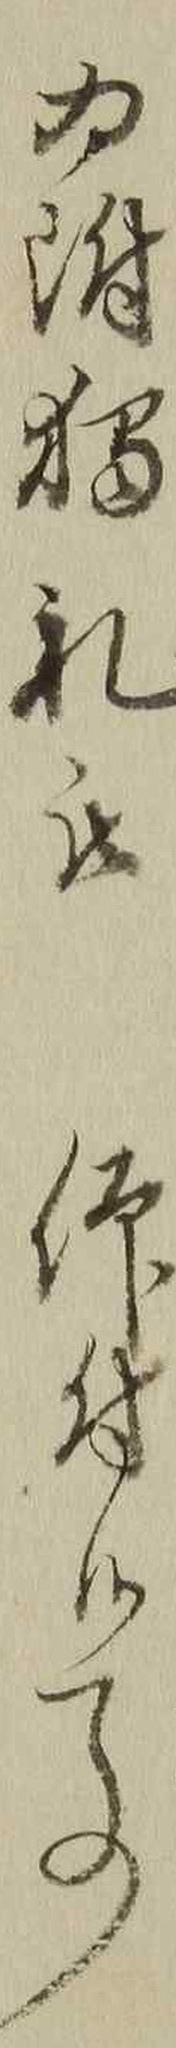為附独礼被仰付候事
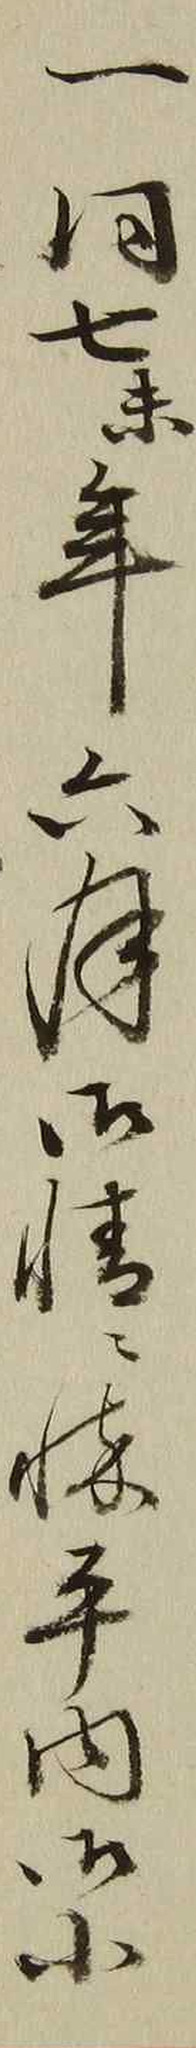一同七未年六月御情ニ忰平内御小
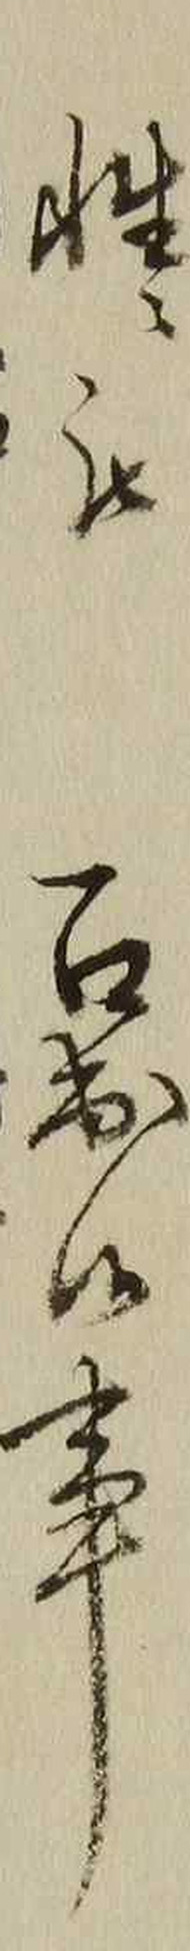性ニ被召出候事
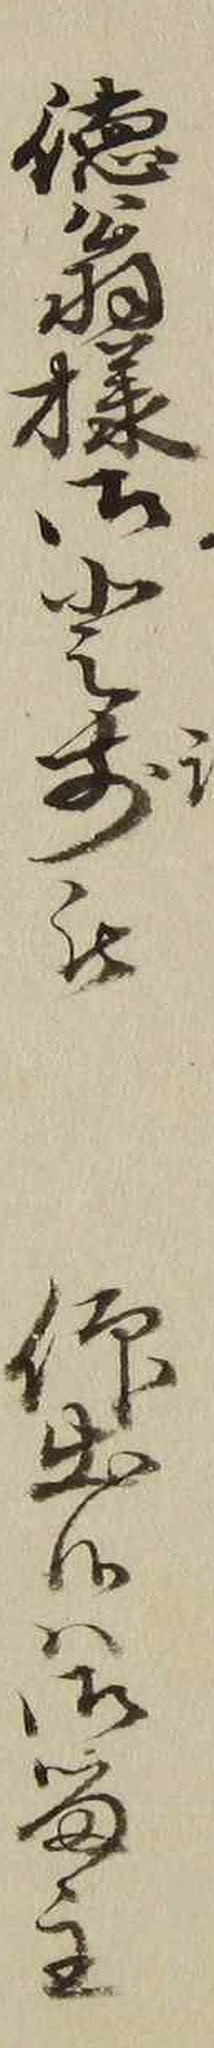徳翁様御登前被仰出候ハ御留主
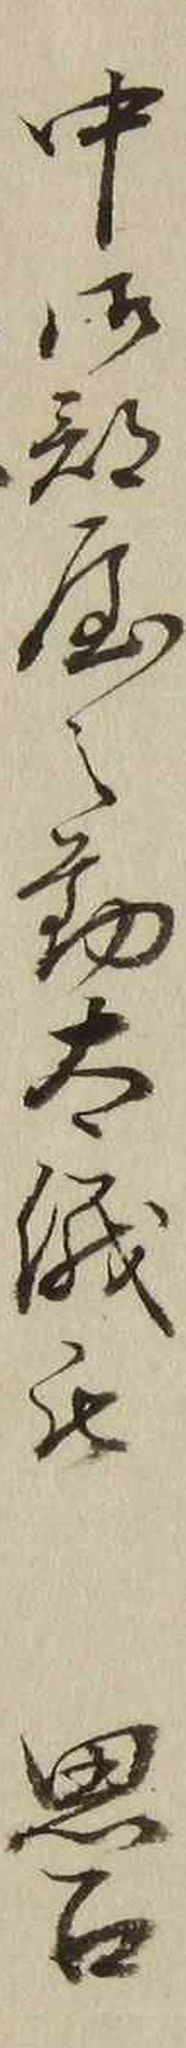中御部屋之勤太儀被思召
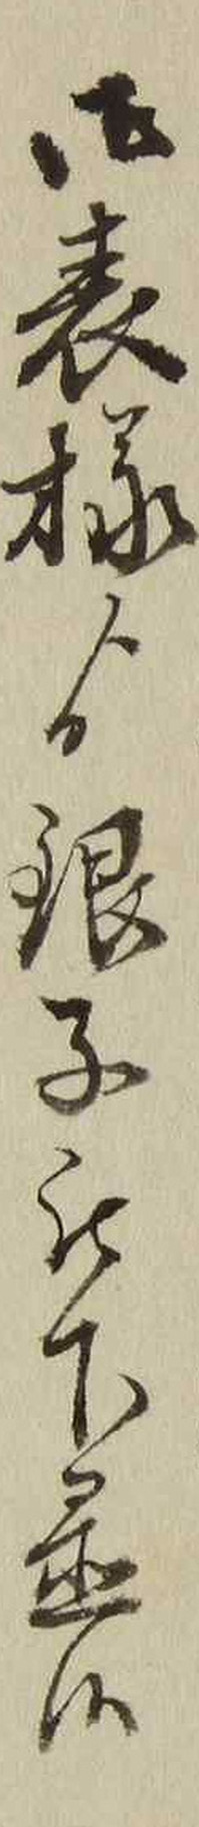御表様ゟ銀子被下置候
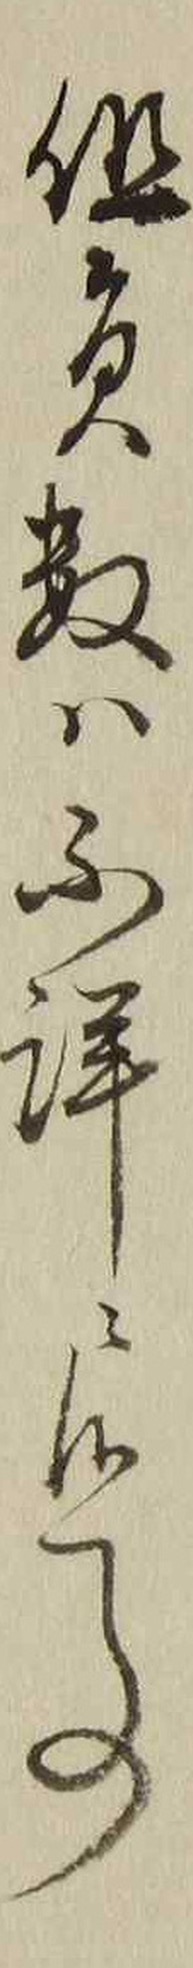但員数ハ不詳ニ候事
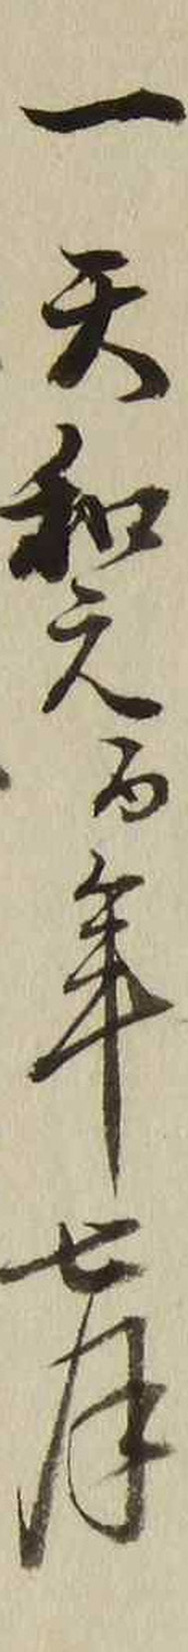一天和元酉年七月
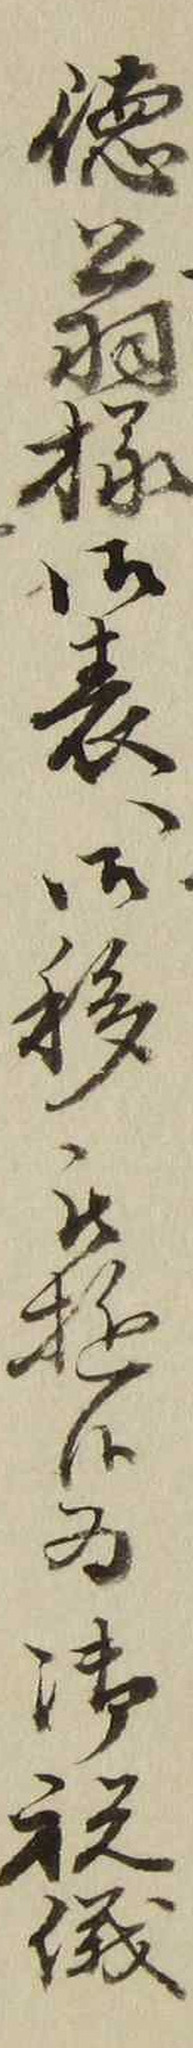徳翁様御表へ御移被遊候為御祝儀
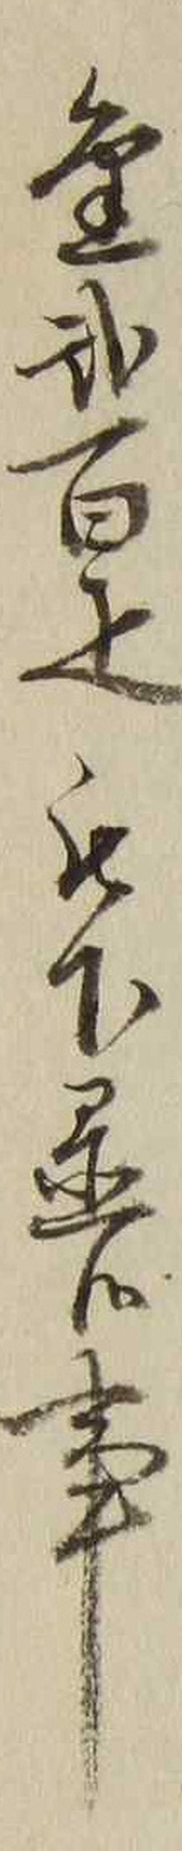金弐百疋被下置候事
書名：諸士系譜　巻之36　は之部4
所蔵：会津若松市立会津図書館
